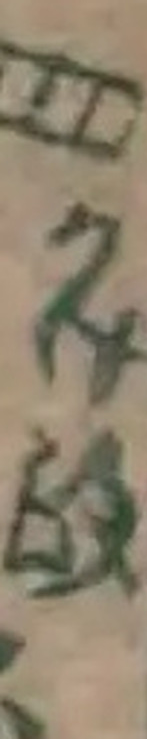かけ政
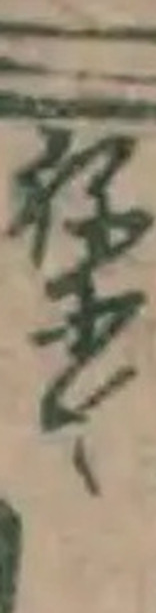ねにて
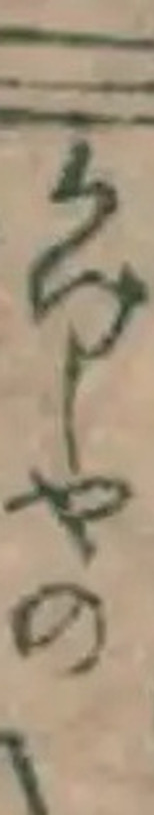かけしやの
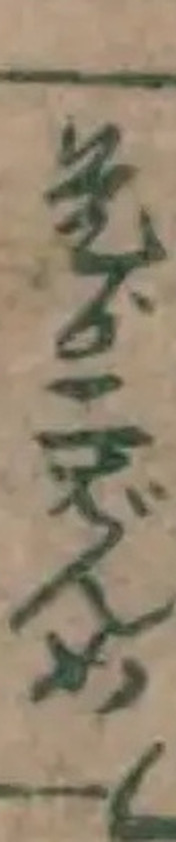是より二ばんめ
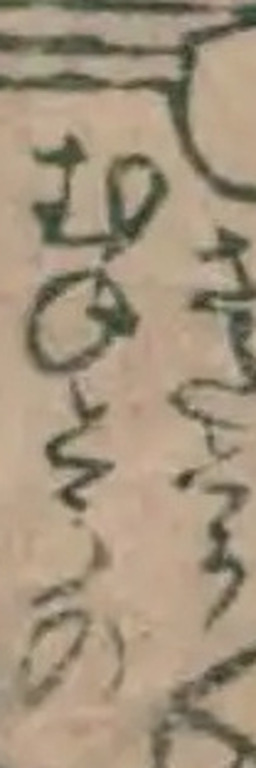むねとうの
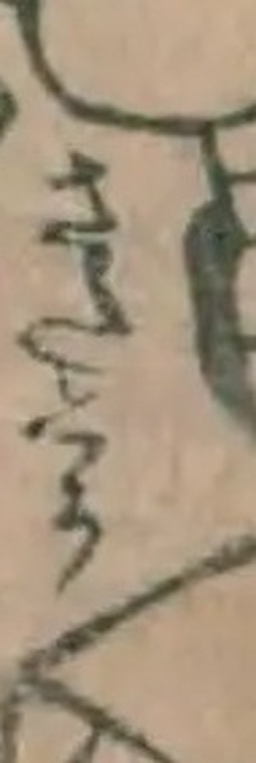さたとう
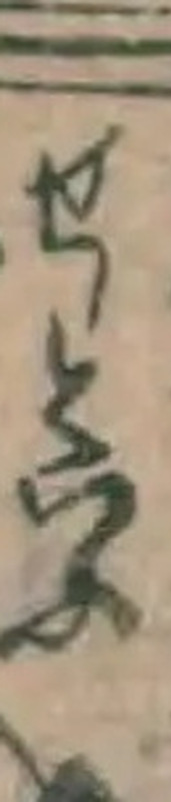せしといふ
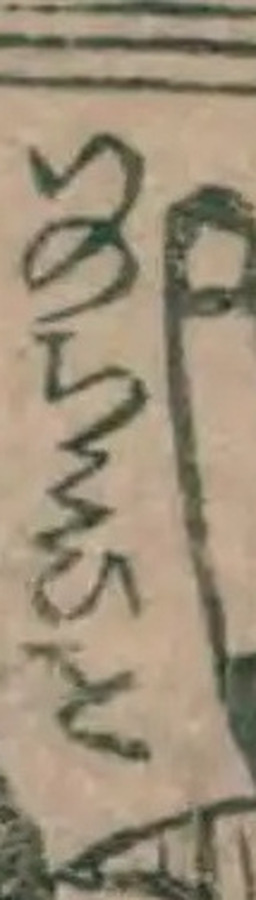いのちこひを
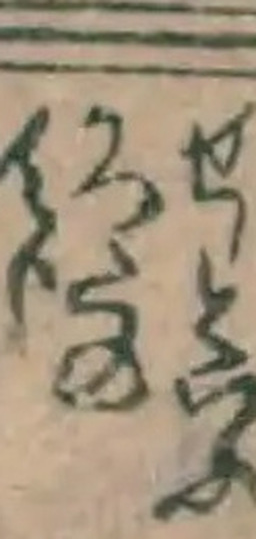かつたの
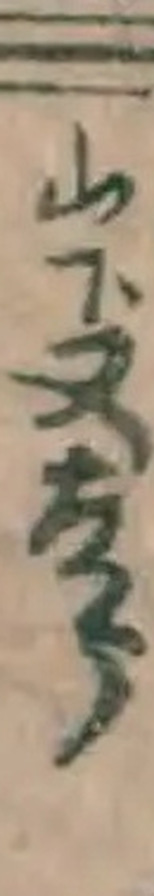山下又太郎
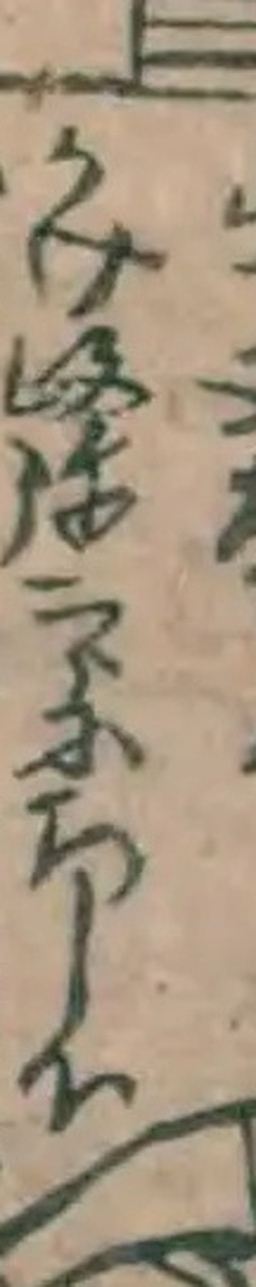かけ政弥二郎にちしほ
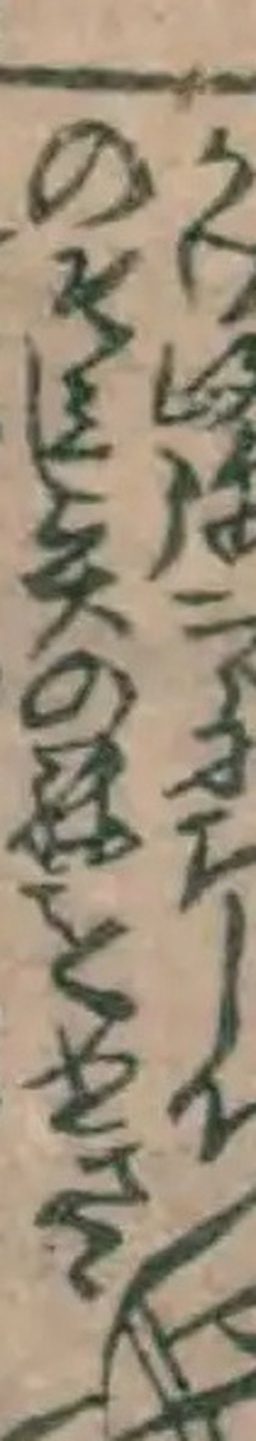のそみし矢のねをめきゝ
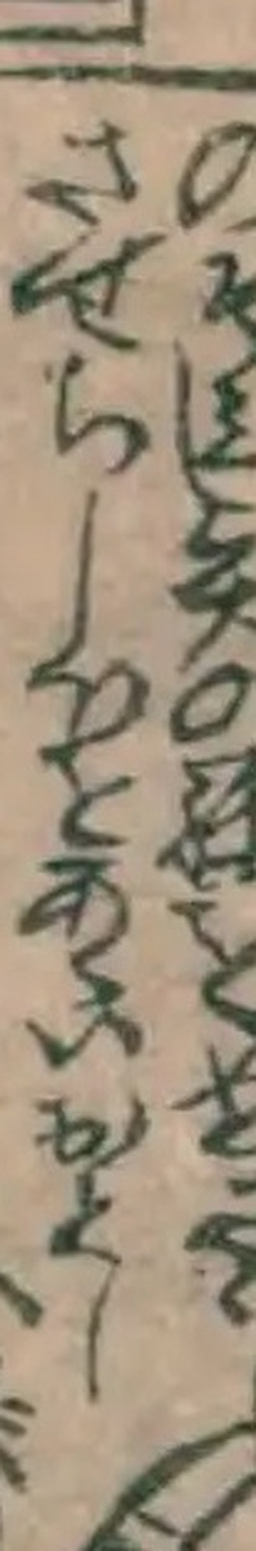させちしほをあらいおとし
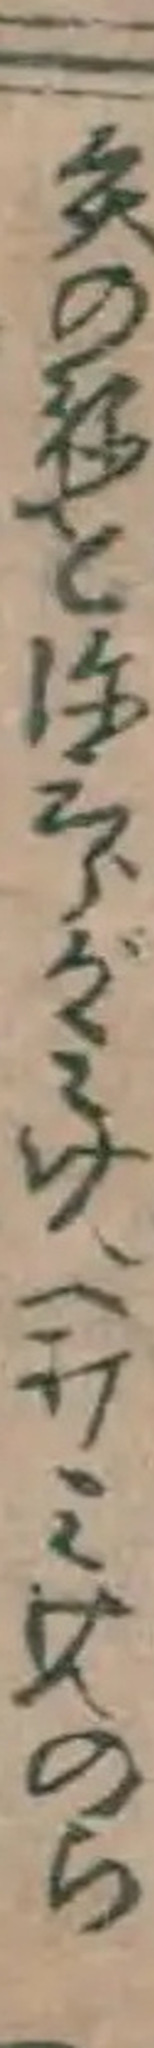矢のねを弥三郎がみけんへ打みけんのち
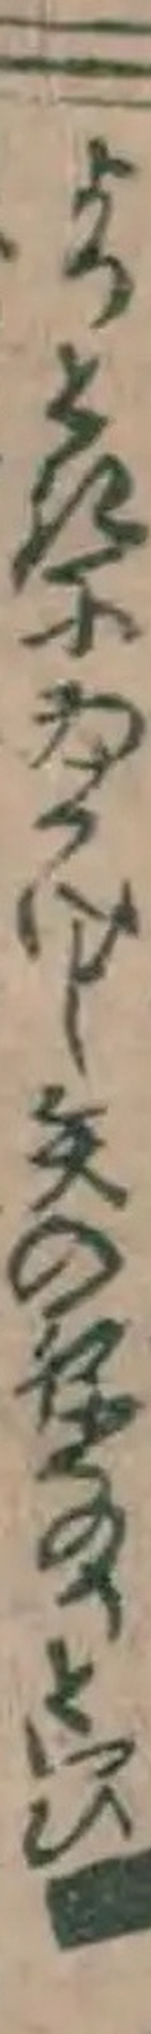よりときにゐかけし矢のねなりといひ
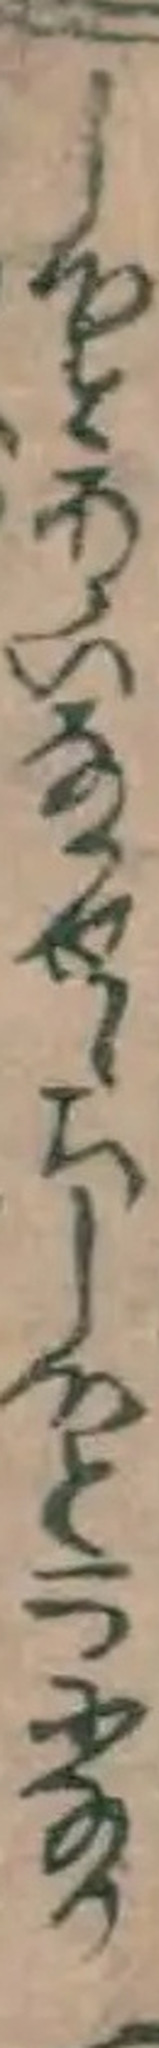しほとあらいなかせしちしほと一つになり
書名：伊達錦對将 : 森田座
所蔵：国立国会図書館 National Diet Library, JAPAN
